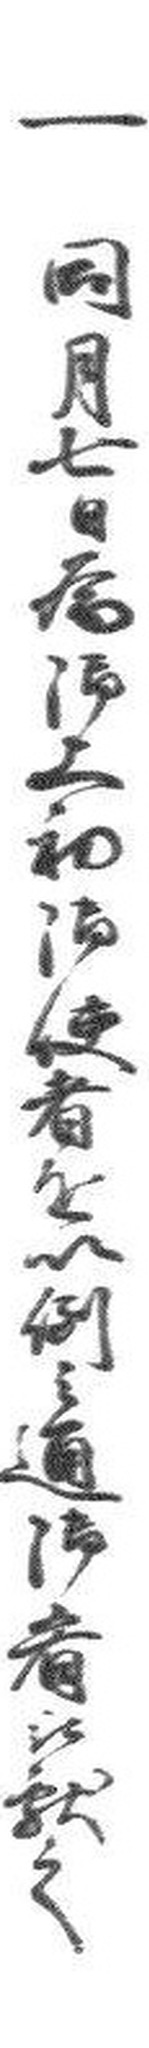一同月七日為御上初御使者を以例之通御肴被献之
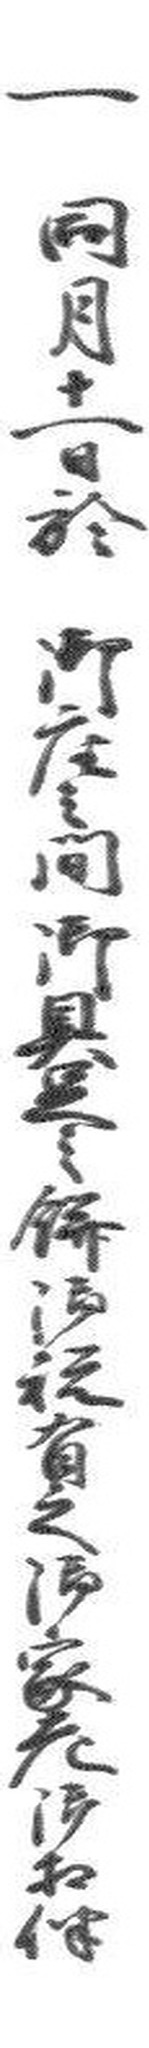一同月十一日於御座之間御具足之餅御祝有之御家老御相伴
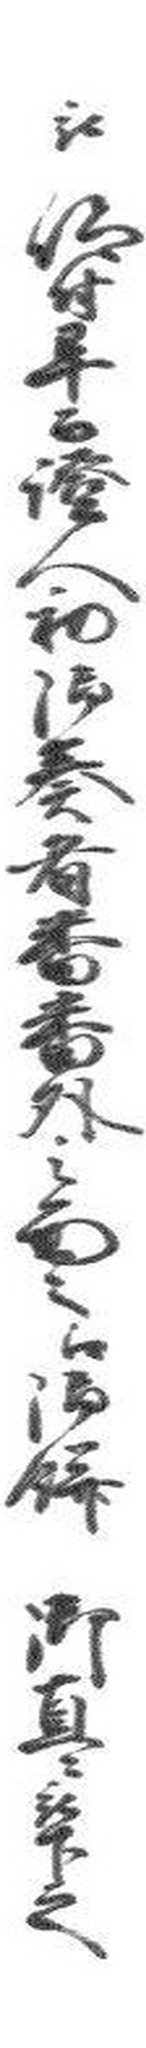被仰付畢而證人初御奏者番番外之面々江御餅御直ニ被下之

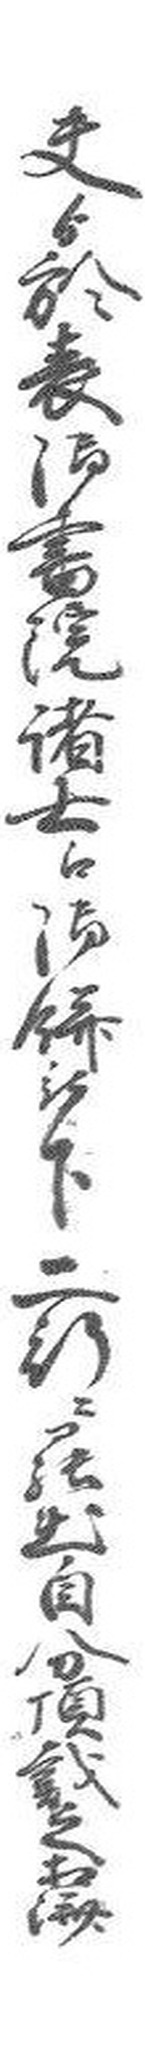夫ゟ於表御書院諸士江御餅被下二行ニ罷出自分頂戴之相済
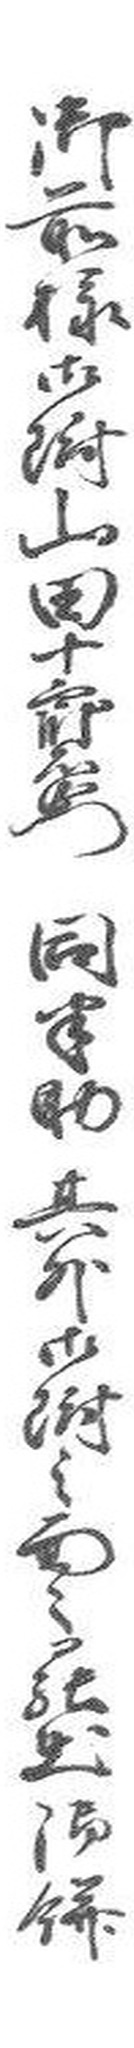御前様御附山田十郎右衛門同半助其外御附之面々罷出御餅
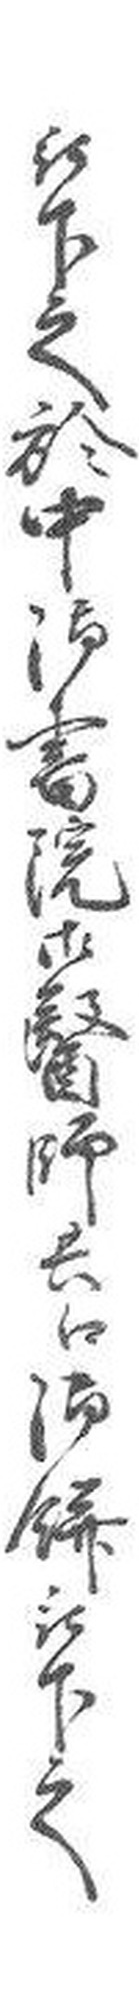被下之於中御書院御医師共江御餅被下之
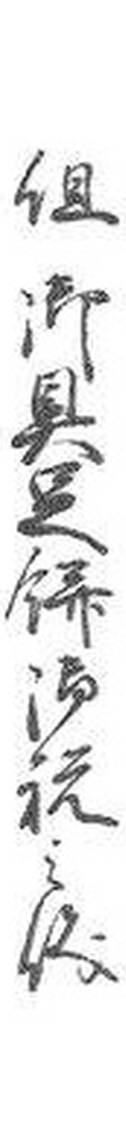但御具足餅御祝之儀
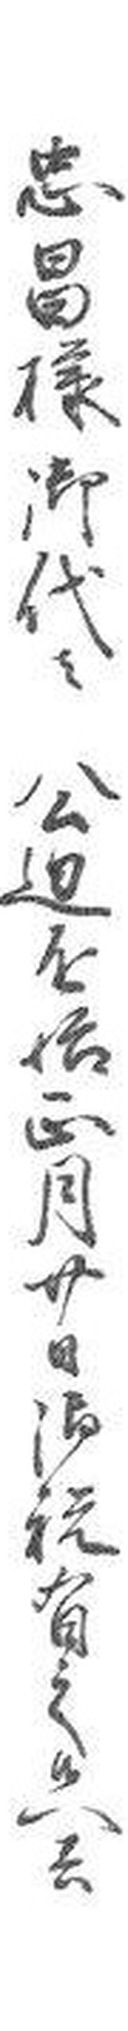忠昌様御代は公辺を始正月廿日御祝有之候へ共
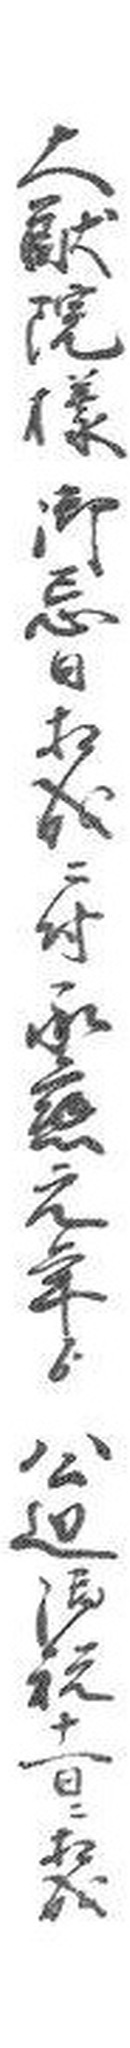大猷院様御忌日相成ニ付承応元年ゟ公辺御祝十一日ニ相成
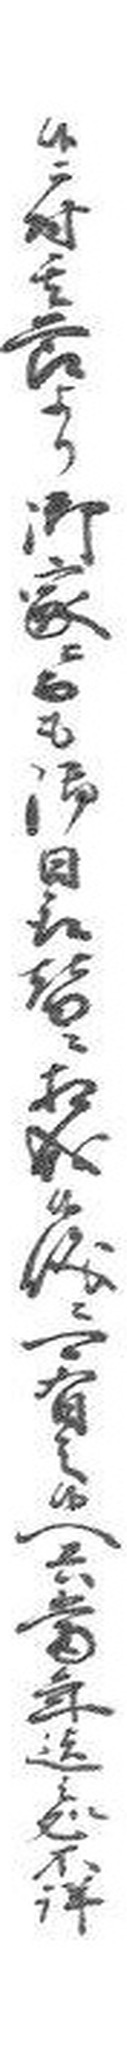候ニ付其節より御家ニ而も御日取替ニ相成候儀ニ可有之候へ共当年迄之処不詳
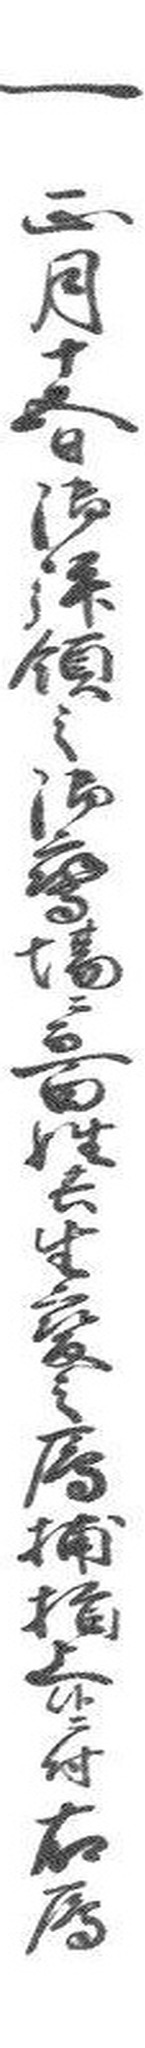一正月十五日御拝領之御鷹場ニ而百姓共生変之雁捕指上候ニ付右雁
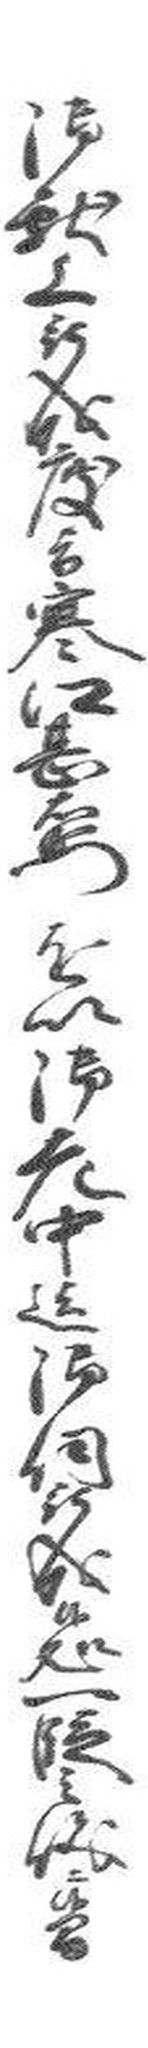御献上被成度旨寒江甚右衛門を以御老中迄御伺被成候処一段之儀ニ候間
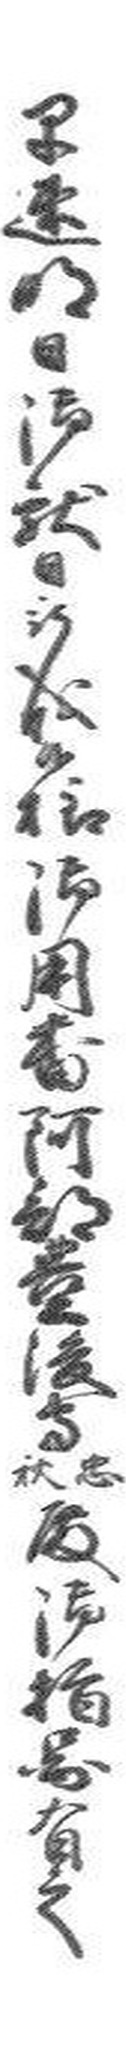早速明日御献日被成候様御用番阿部豊後守忠秋殿御指図有之
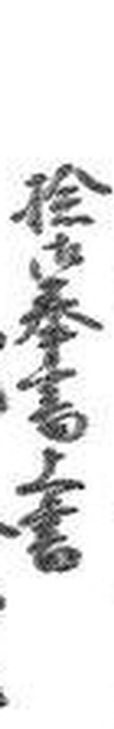捻御奉書上書
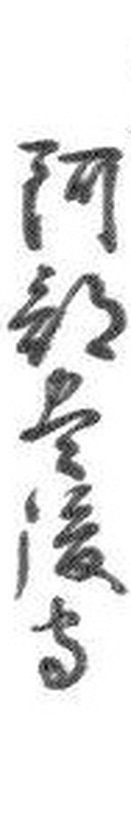阿部豊後守
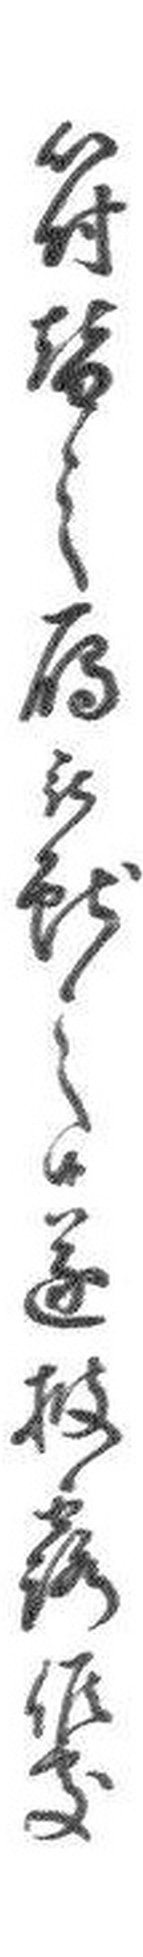符替之雁被献之候遂披露候処
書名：家譜 六 光通公 従万治三年到寛文三年
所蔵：福井県文書館 Fukui Prefectural Archives
